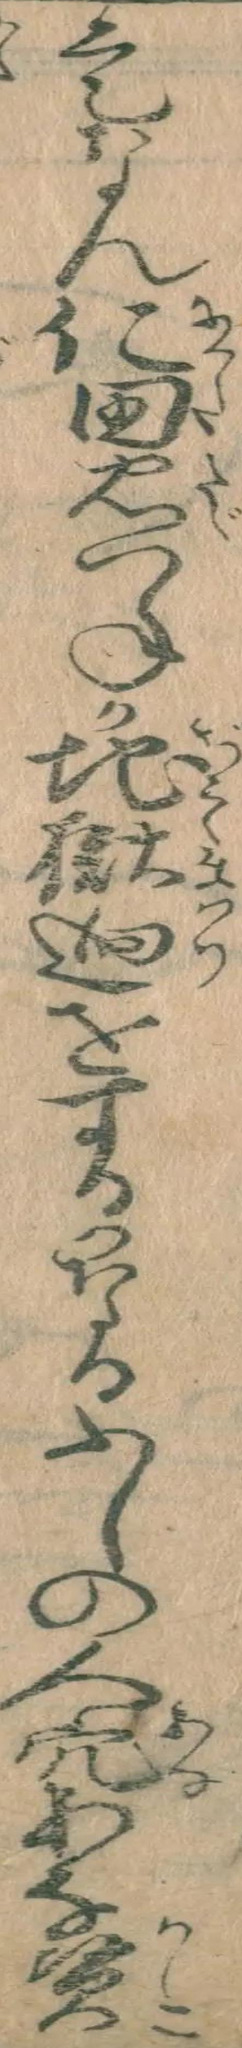是なん仁田忠つねか地獄廻をするかなるふしの人穴あな賢
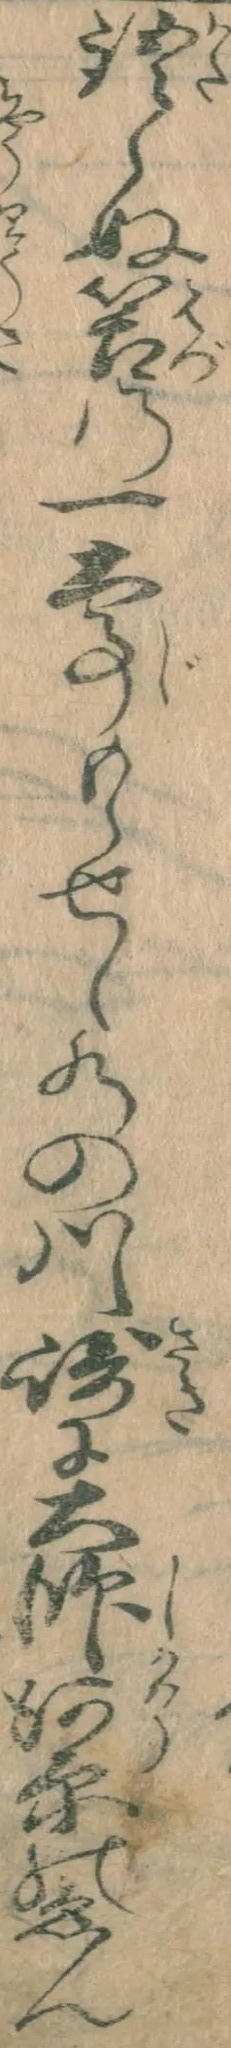語らぬ筈の一大事もらせし水の川崎に大師河原のゑん
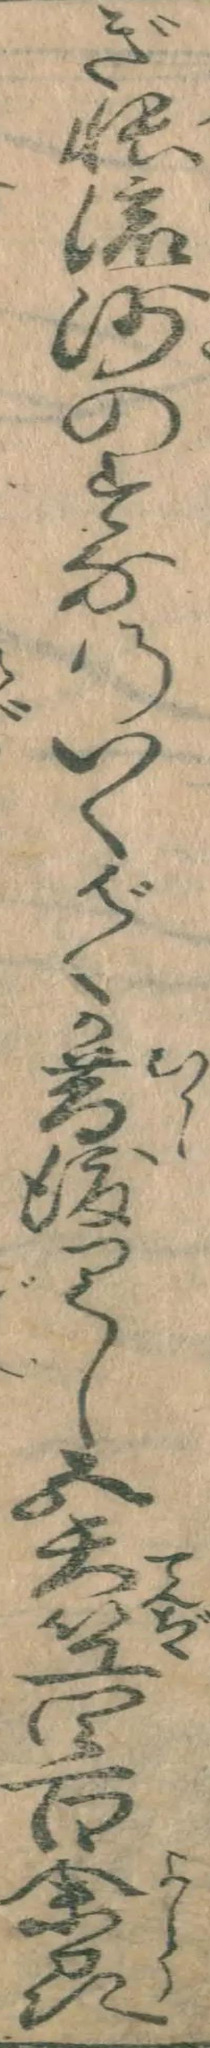ぎ帳流沙のすなのいくばくか昔渡りし五天竺四百余州
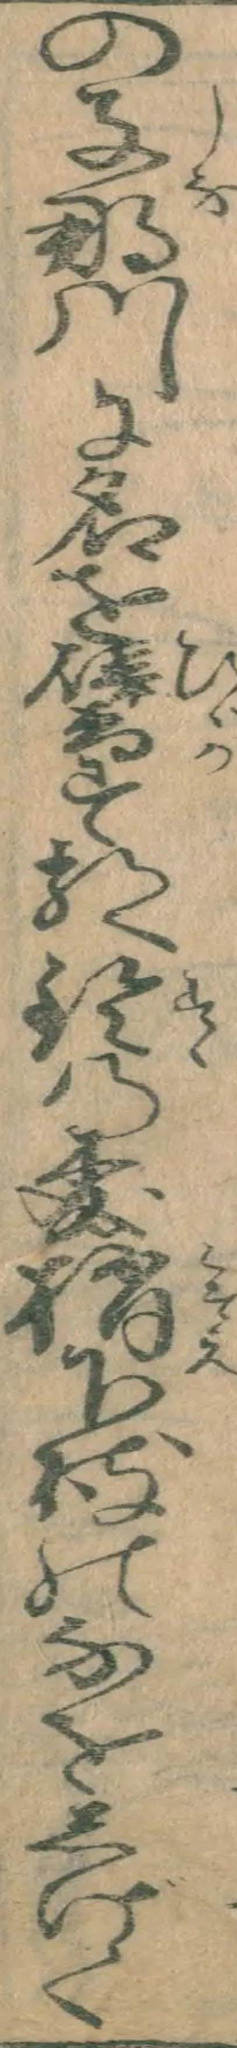の事那川に名を響する鈴の森梢下枝のなをしげく

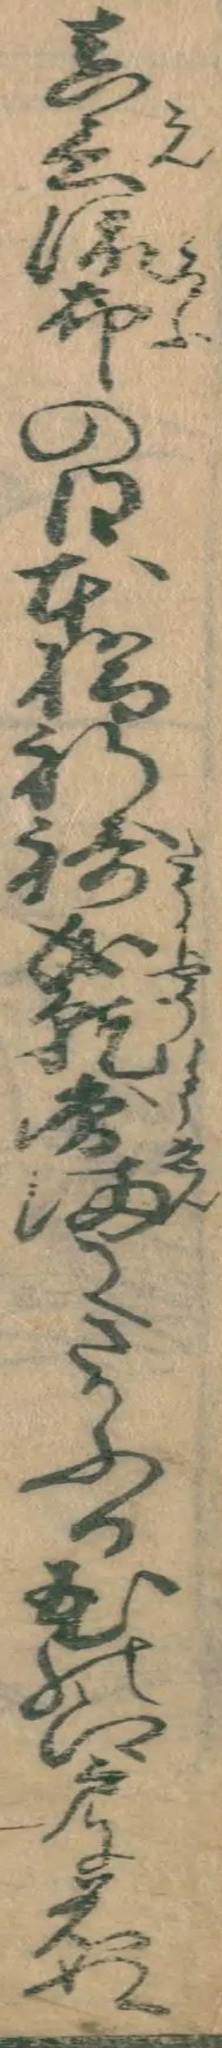真言流布の日本橋祈祷成就円満にさかふる花の江戸に着ぬ
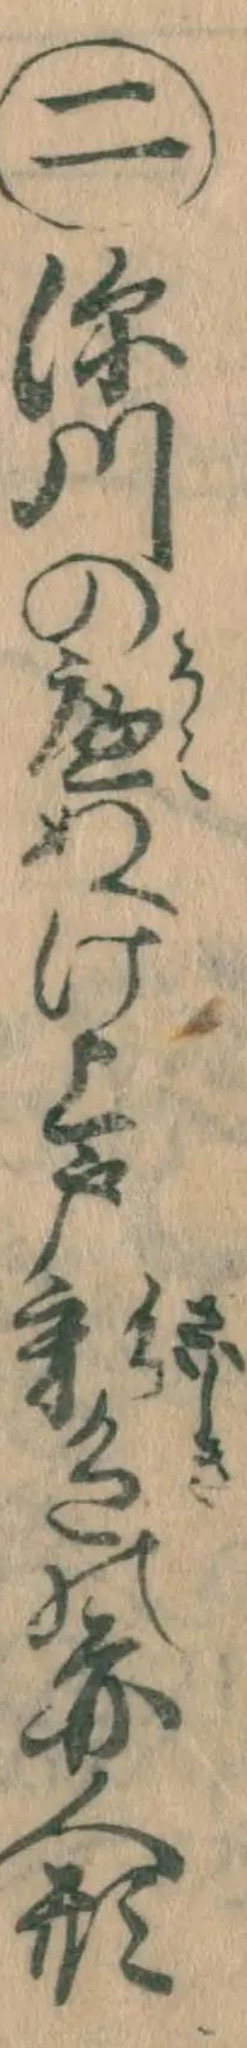二深川の底ぬけ上戸彩色の赤人形
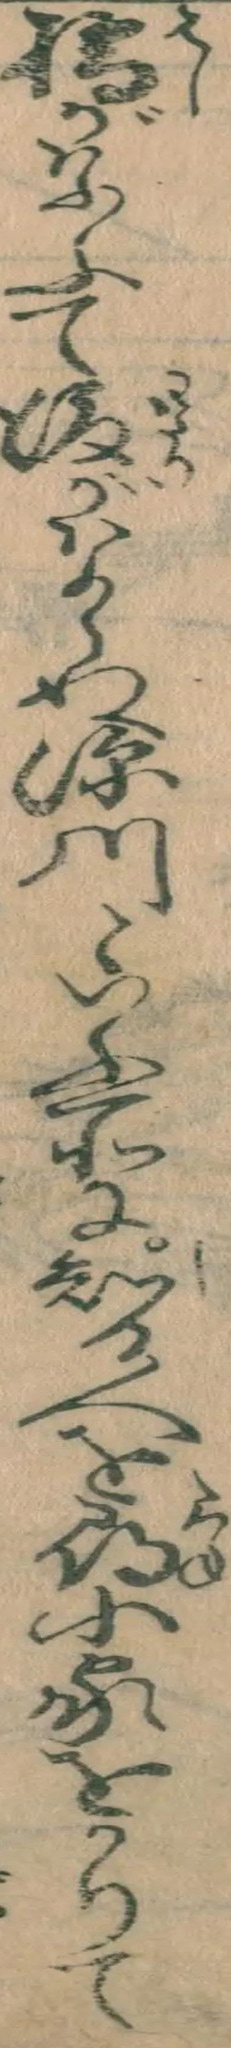橋がなふて渡がならぬ深川といふ所に。知る人を尋小家をかりて
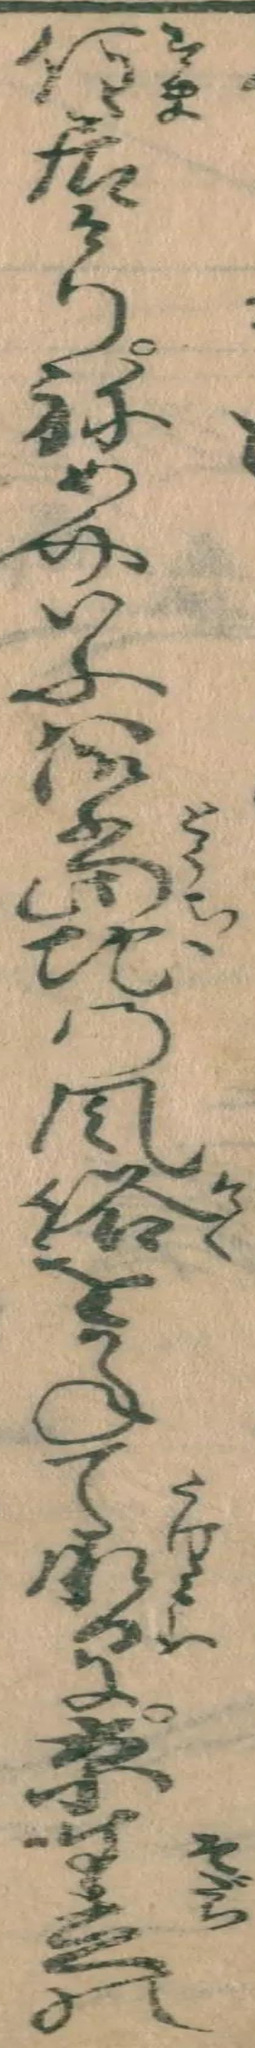住居けり。ねめ介いふは御当地の風俗をかねて承るに。京生立の
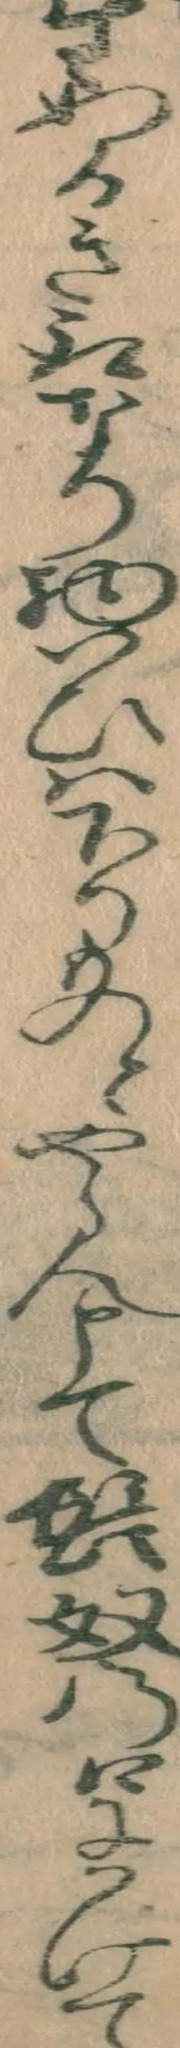生ぬるき取なり物いひは下りものとやらん申て髭奴の口にかけて
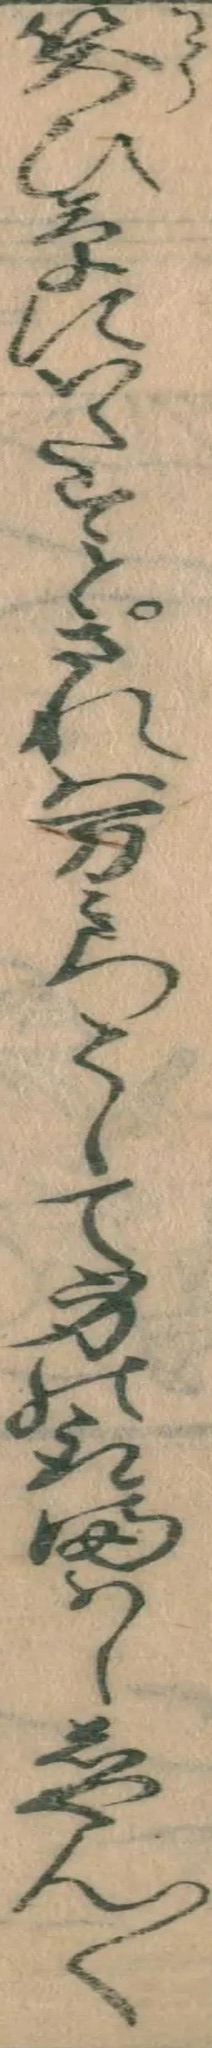笑ひ草にいたすと。されは万きつとして身の取まはししやん〳〵
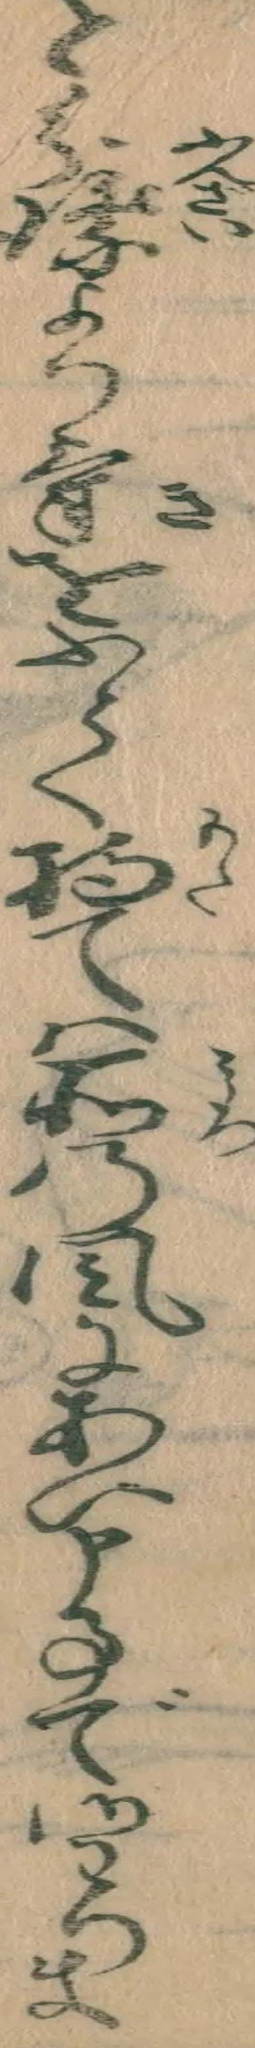と分際より気をふとく持ては所の風にあい申事で御わりま
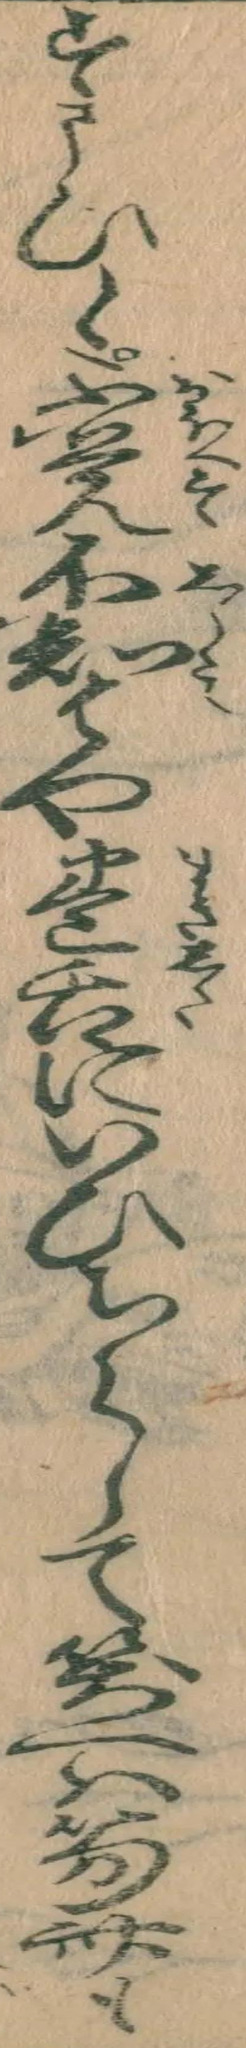すまひし。不覚不知はや巻舌にいひちらして笑へは筍斎も
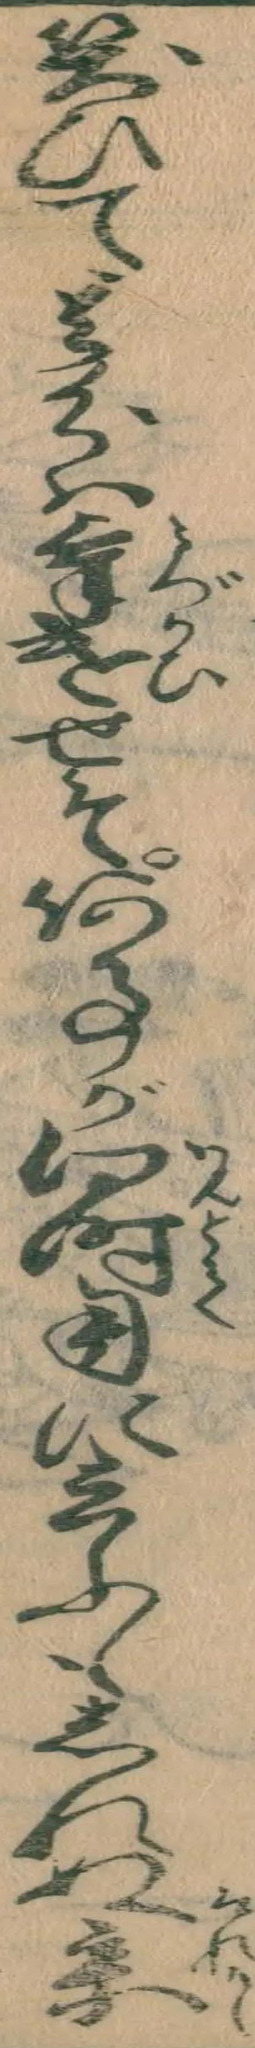笑ひて其分は気遣せそ。何事が何時用に立ふもしれぬ某
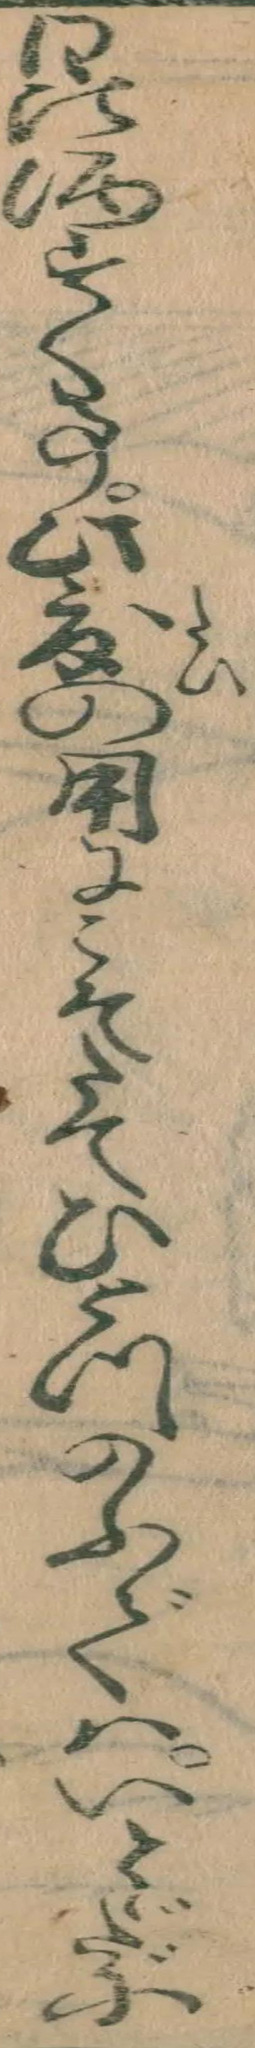日比酒すく事。此度の用にこそたてひとつのふでは。いとゞだに
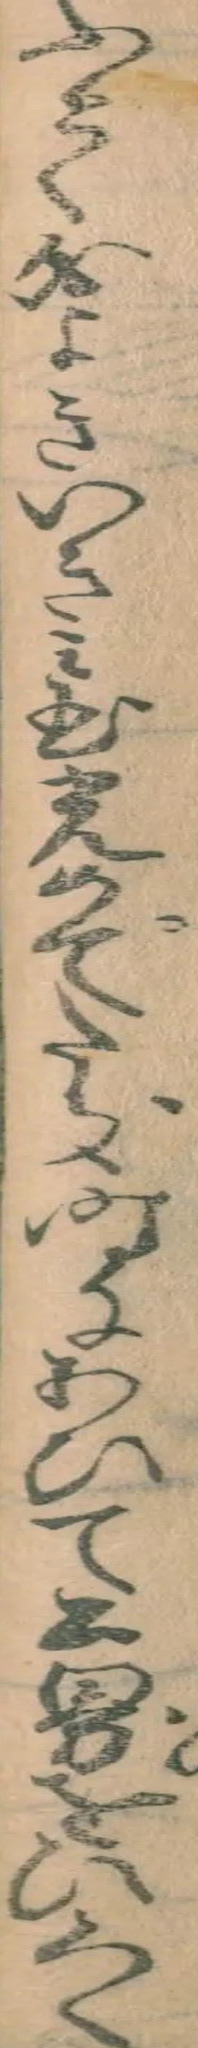ふとく成よきいきみ玉光めてたき時にあひて工界をひろく
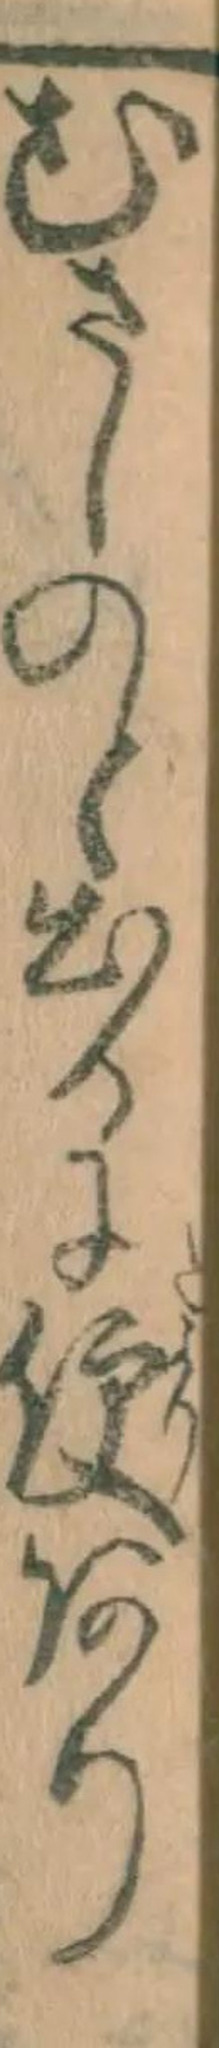むさしのと出るに便あり
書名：新竹斎 5巻
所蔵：国立国会図書館 National Diet Library, JAPAN
